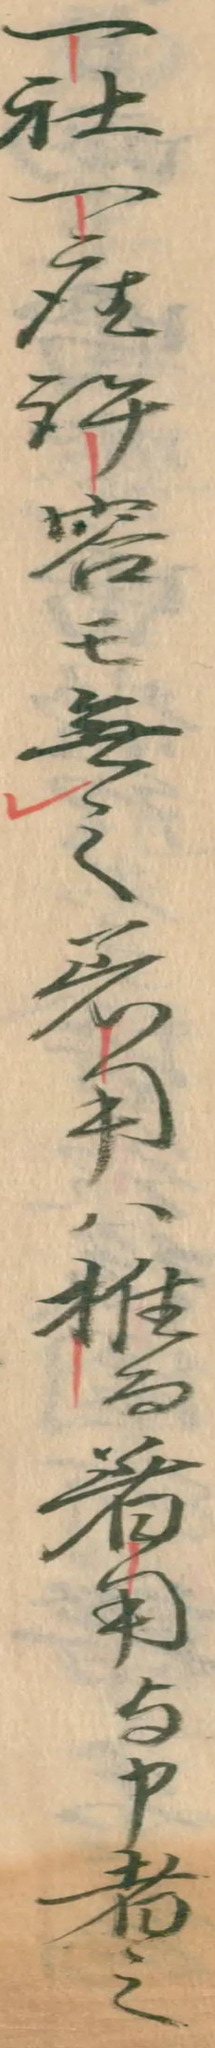一-社一-座許-容モ無之着-用ハ推_而着-用与申者之
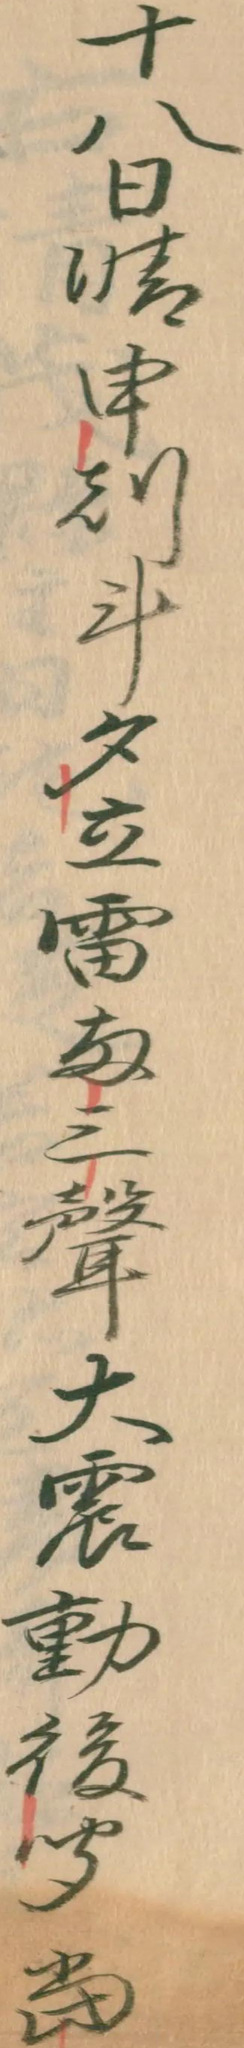十八日晴申_刻計夕_立雷両-三-声大震動後_聞当-
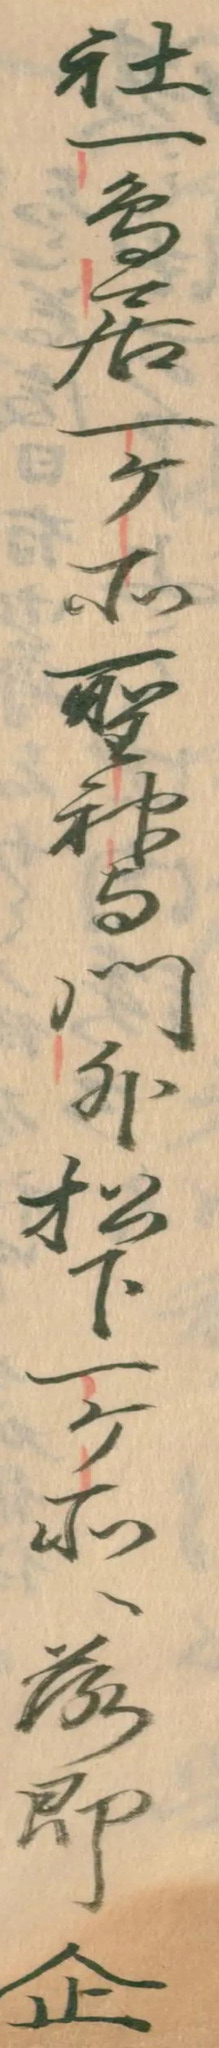社一_鳥_居一-ケ-所聖-神-寺門_外松下一-ケ-所ヘ落即企
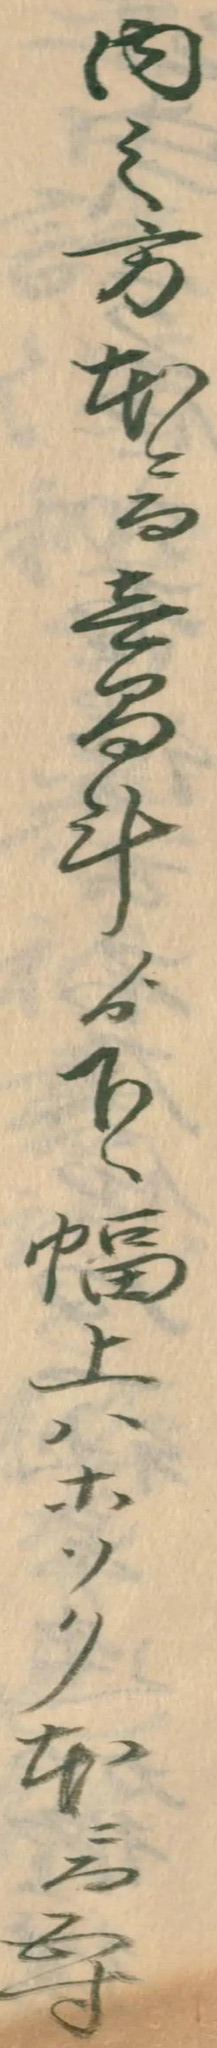内之方本ニ而壱間計ゟ下へ幅上ハホソク本ニ而五寸
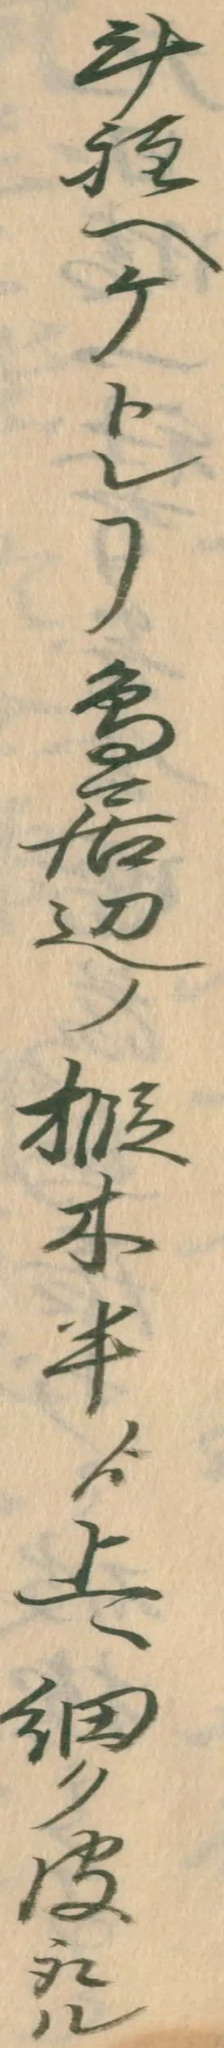計程へケトレコト鳥居辺ノ樅木半ゟ上へ細ク皮取ル
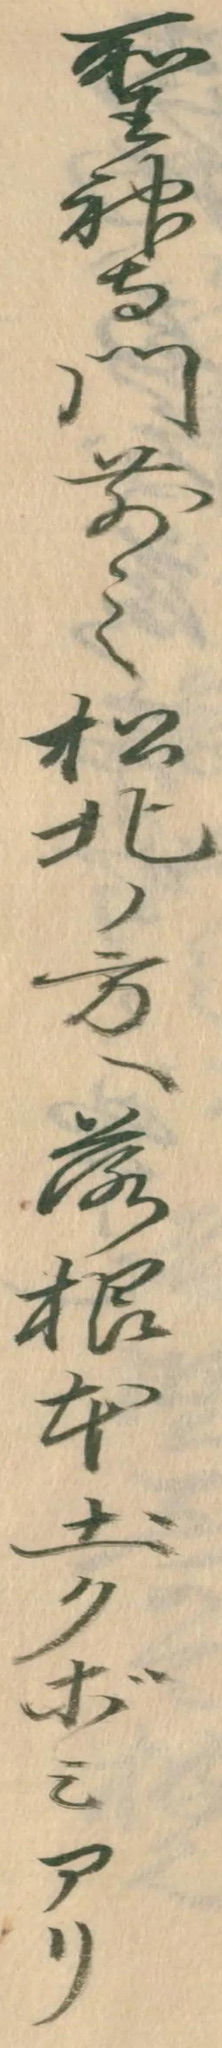聖神寺門前之松北ノ方へ落根本土クボミアリ
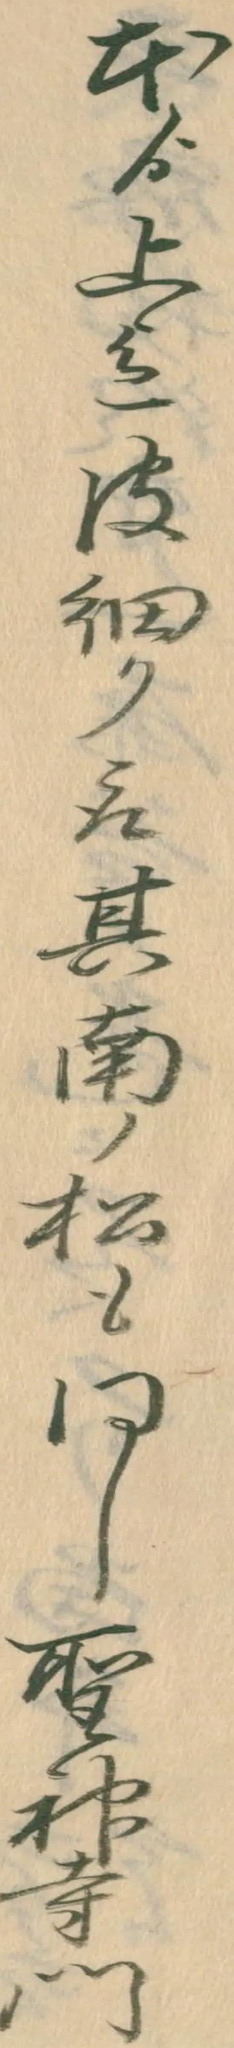本ゟ上迄皮細く取其南ノ松も同し聖神寺門
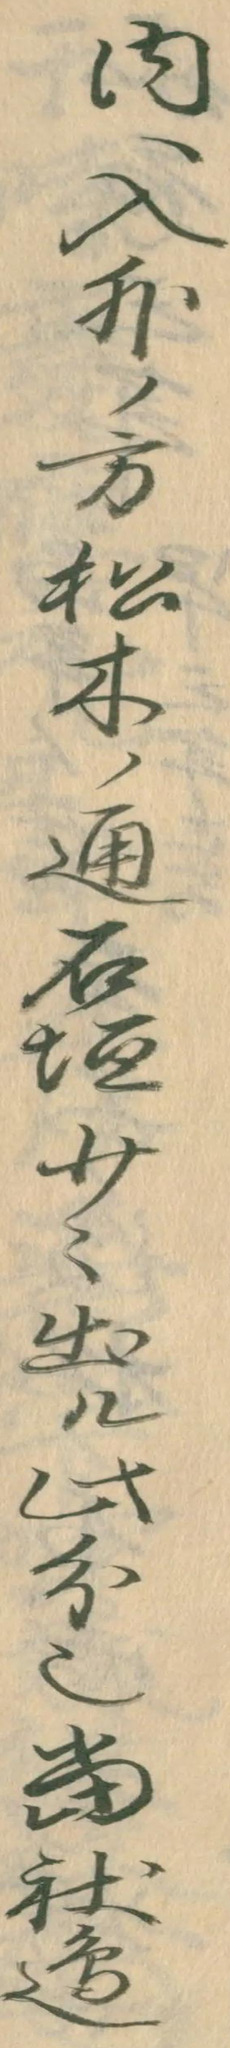内へ入外ノ方松木ノ通石垣少々出ル此分也当社辺
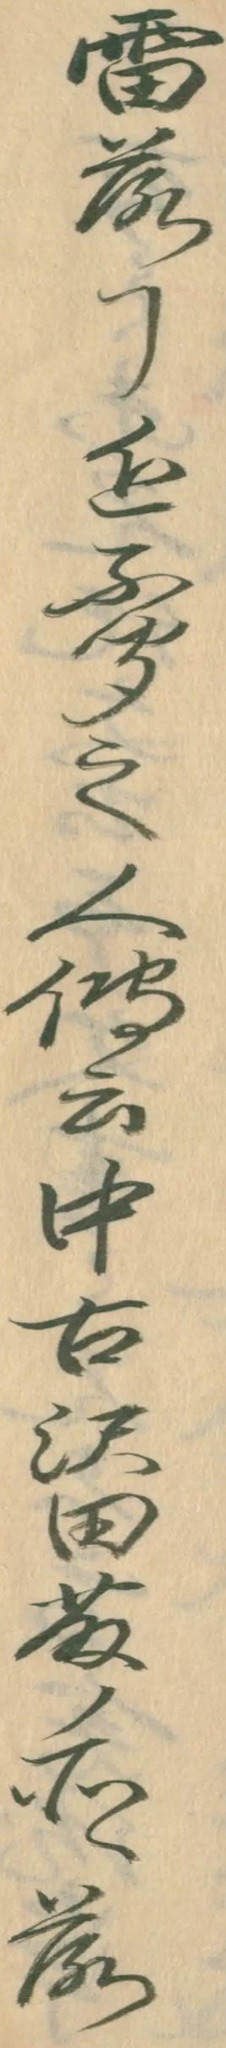雷落コト近不聞之人伝云中古沢田藤ノ所へ落

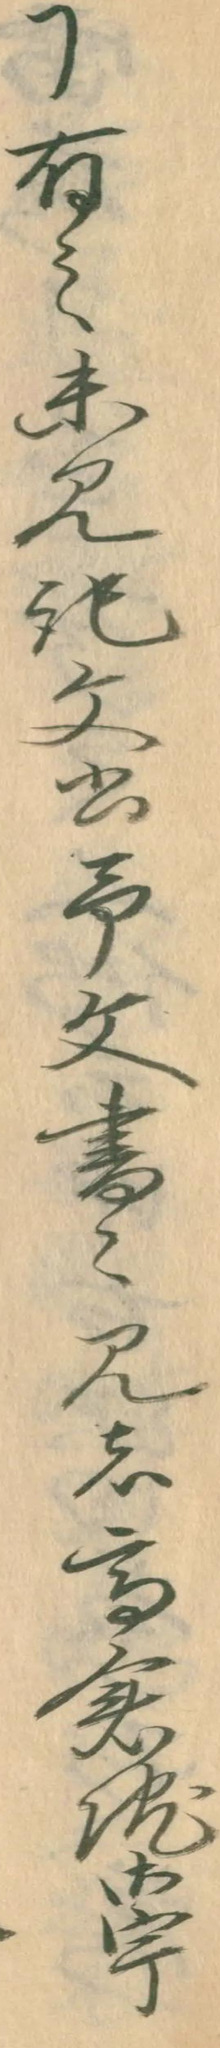コト有之未見記文書予文書々見者高倉院御宇
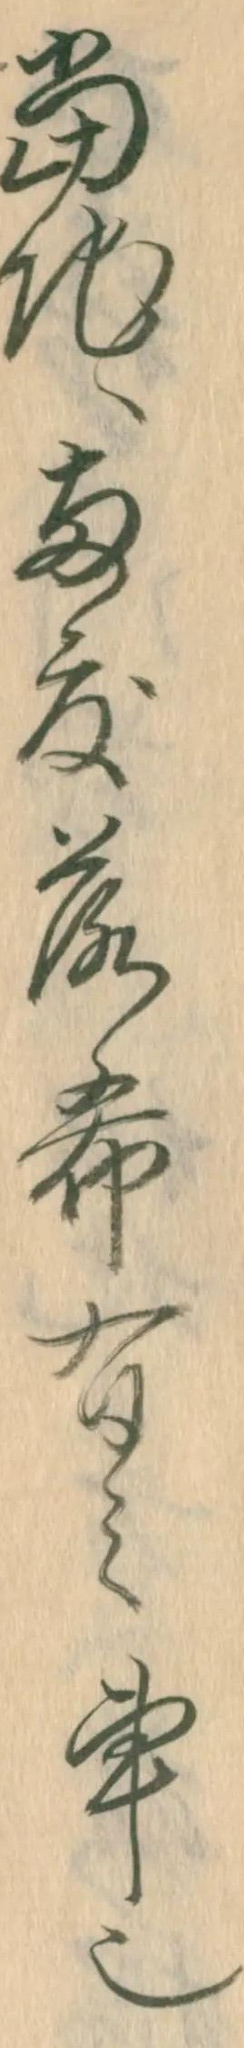当地へ両度落希有之事也
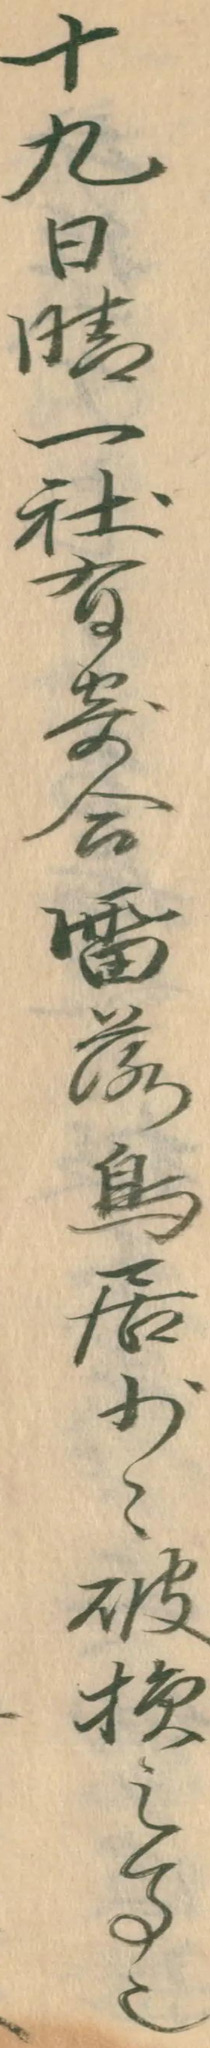十九日晴一社有寄合雷落鳥居少々破損之事也
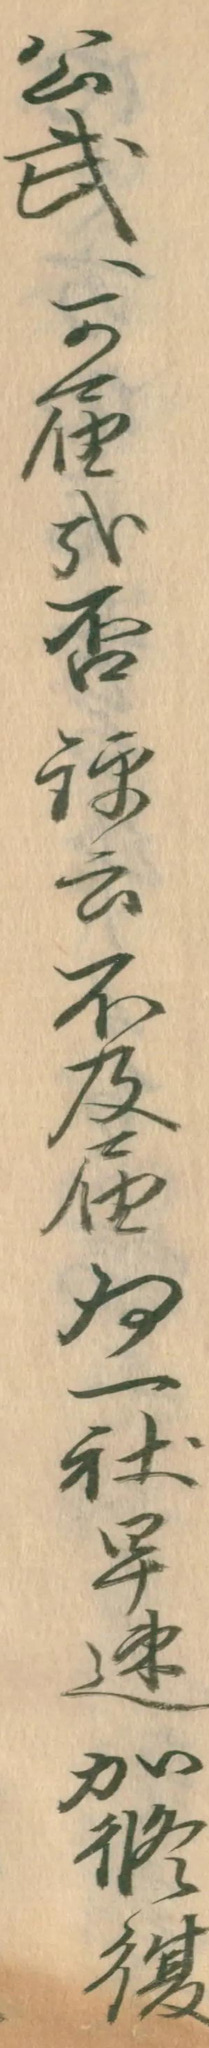公武ヘ可届哉否評云不及届為一社早速加修復
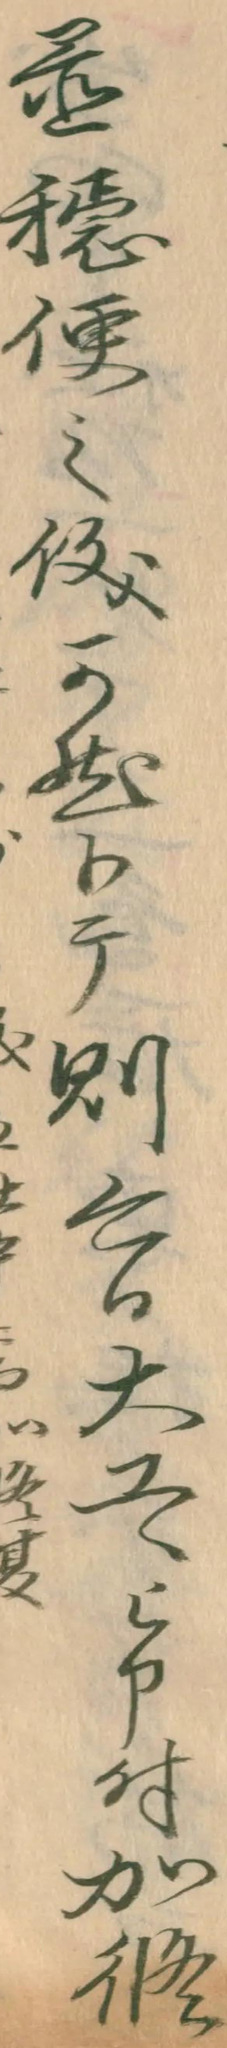置穏便之儀可然トテ則今日大工へ被申付加修
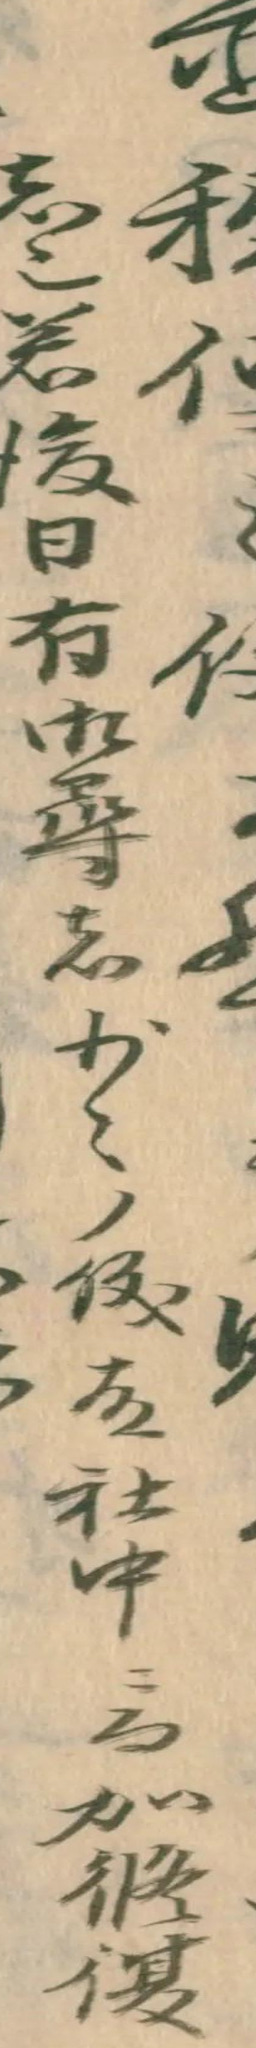者也若後日有御尋者少々ノ儀故社中ニ而加修復
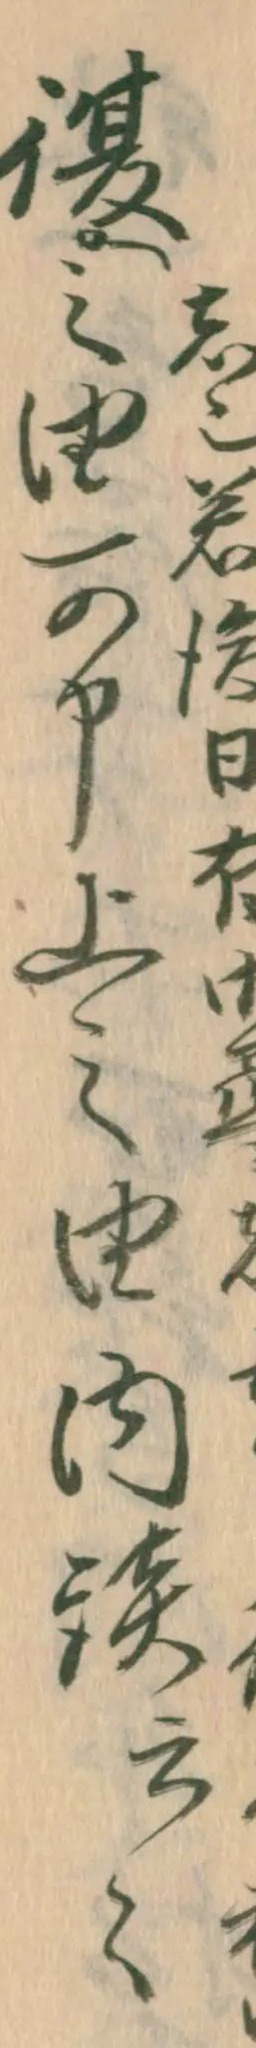復之由可申上之由内談云々
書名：賀茂社記録. 第16冊
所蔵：国立国会図書館 National Diet Library, JAPAN
